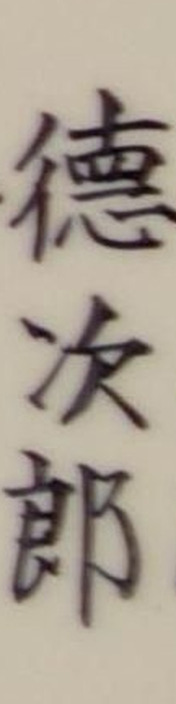徳次郎
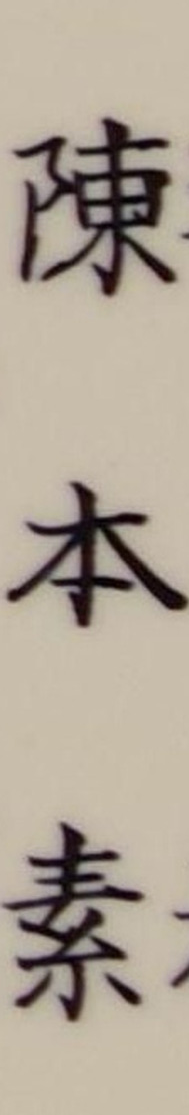陳本素
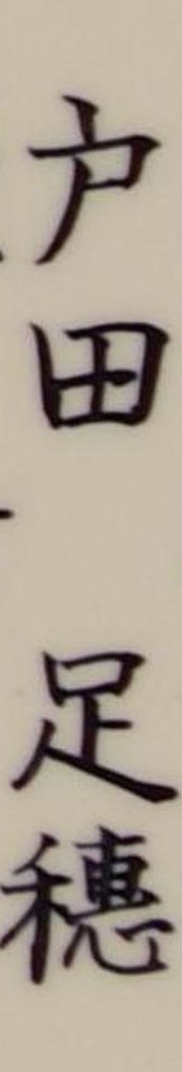戸田足穂
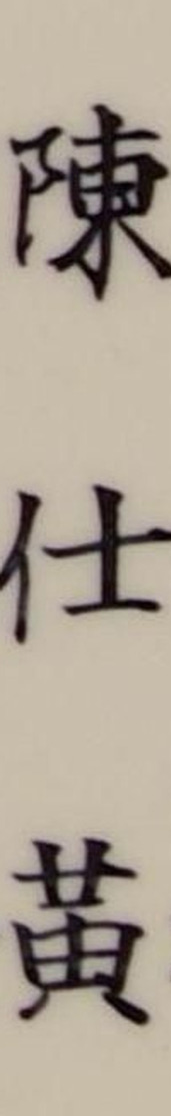陳仕黄
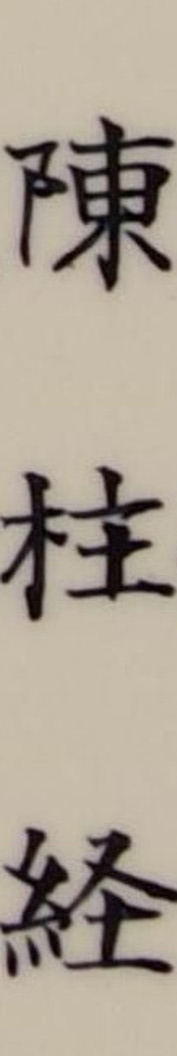陳桂経
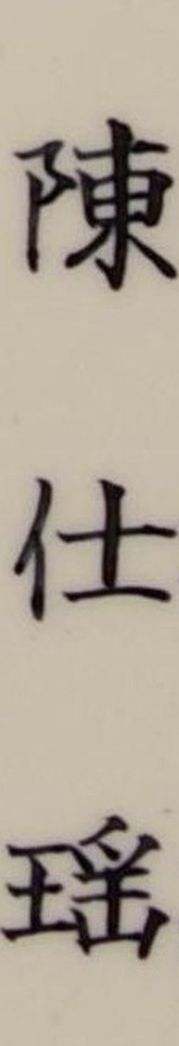陳仕瑶
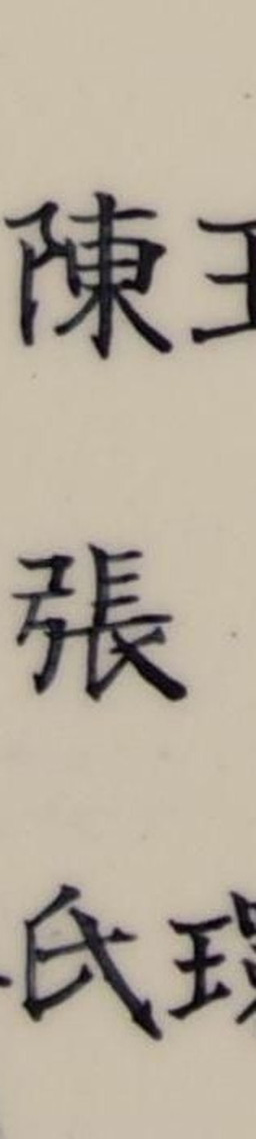陳張氏
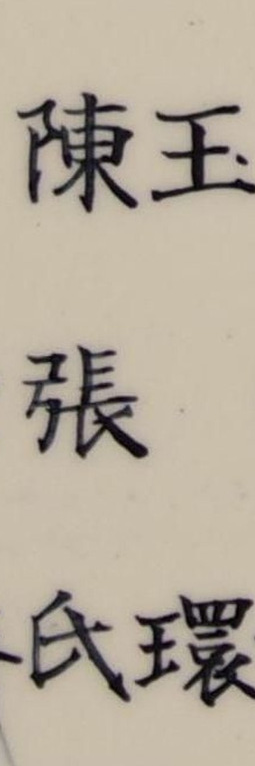陳張氏

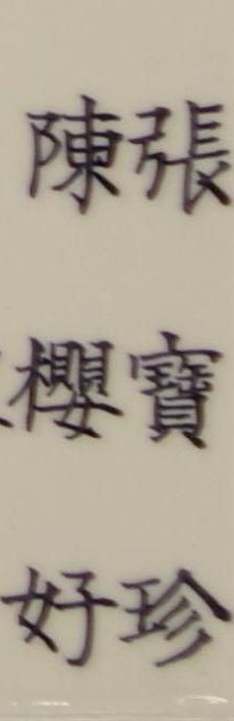陳桜好
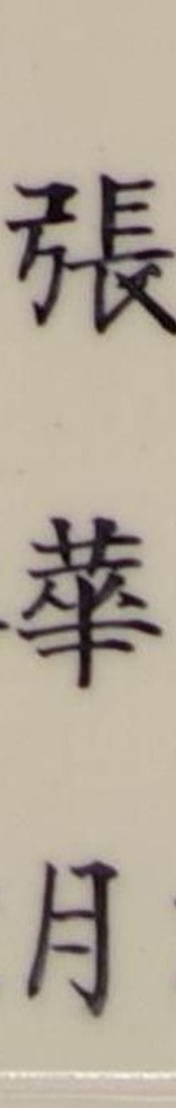張華月
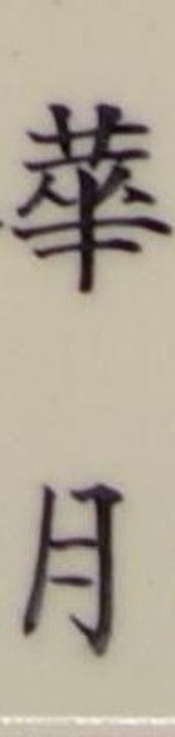張華月
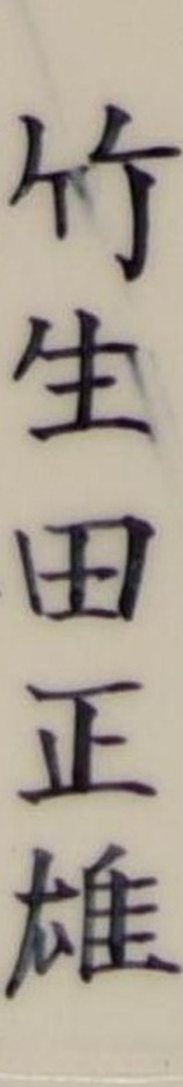竹生田正雄
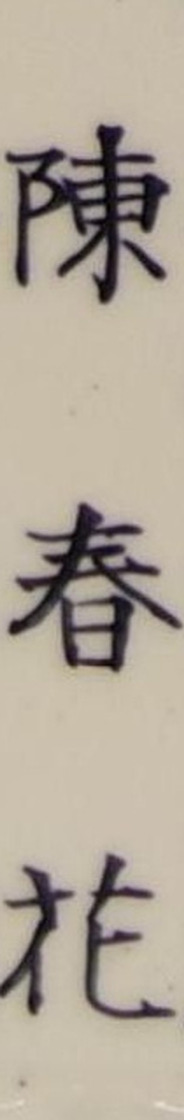陳春花

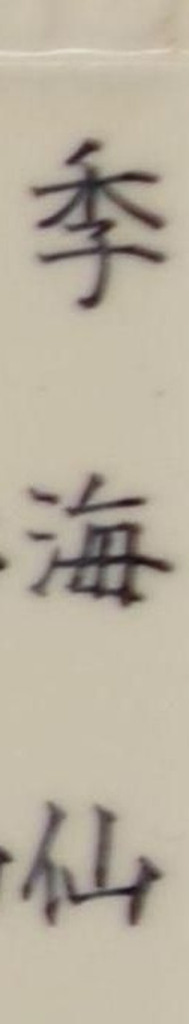季海仙
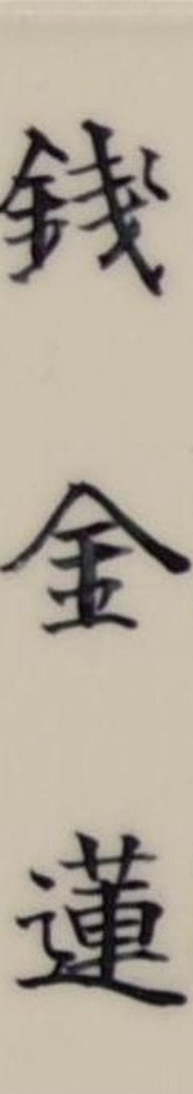銭金蓮
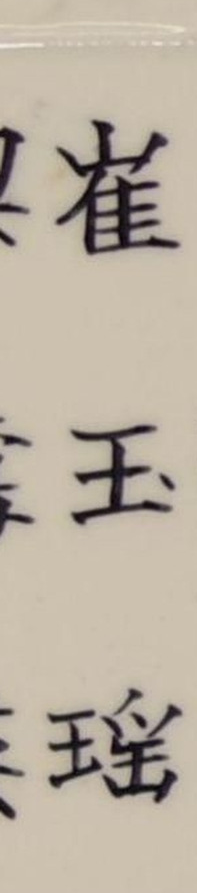崔玉瑶
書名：E~L
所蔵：高野山金剛峯寺
